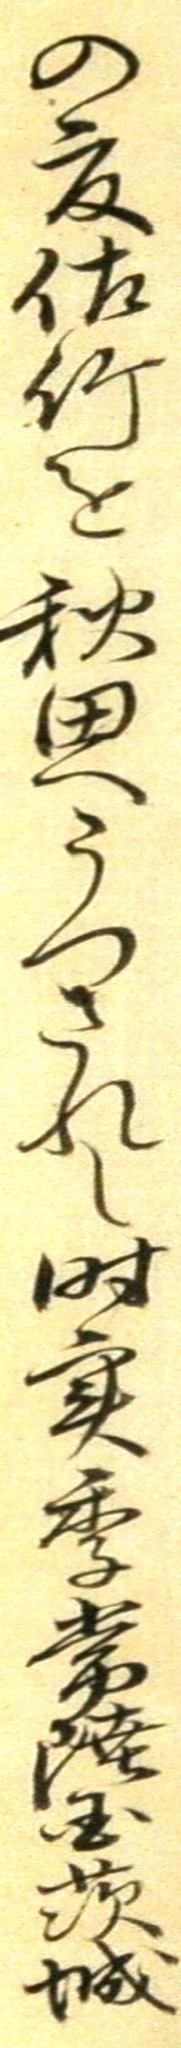の夏佐竹を秋田へうつされし時実季常陸国茨城

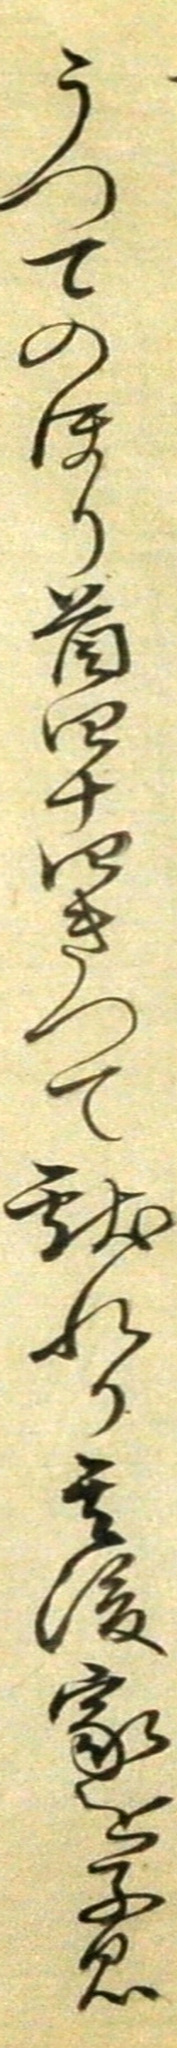うつてのほり首四十四きつて献れり其後家を子息
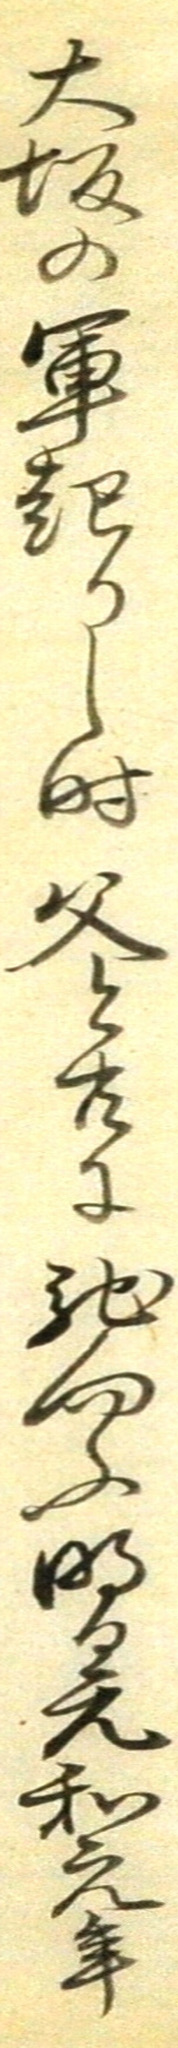大坂の軍起りし時父と共に馳向ふ明る元和元年
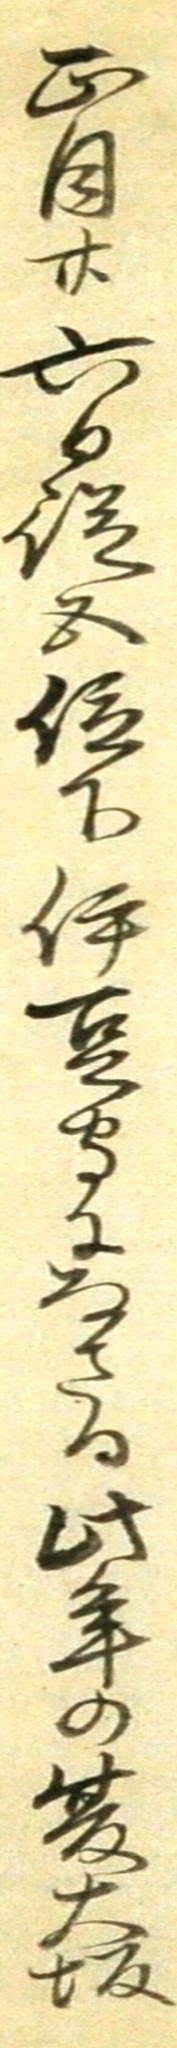正月廿六日従五位下伊豆守になさる此年の夏大坂
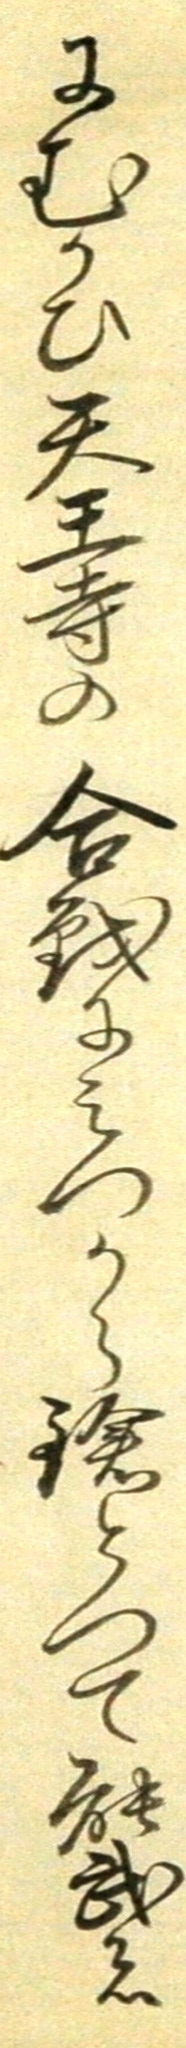にむかひ天王寺の合戦にみつから鎗とつて能武者
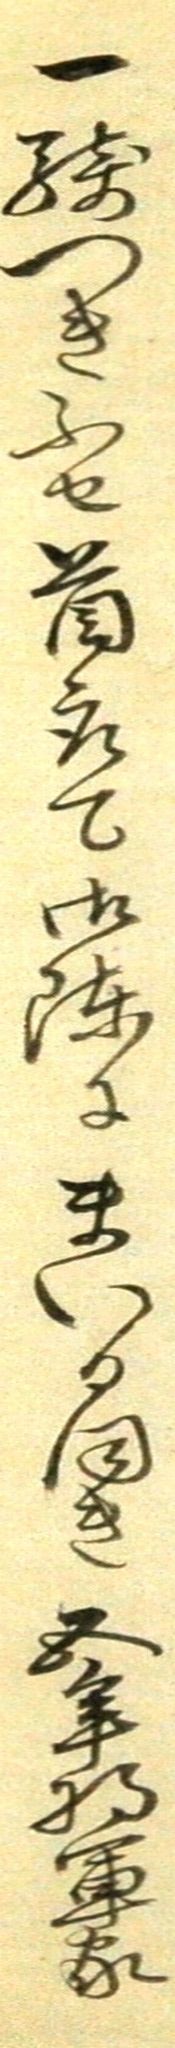一騎つきふせ首取て御陣にまいる同き五年将軍家
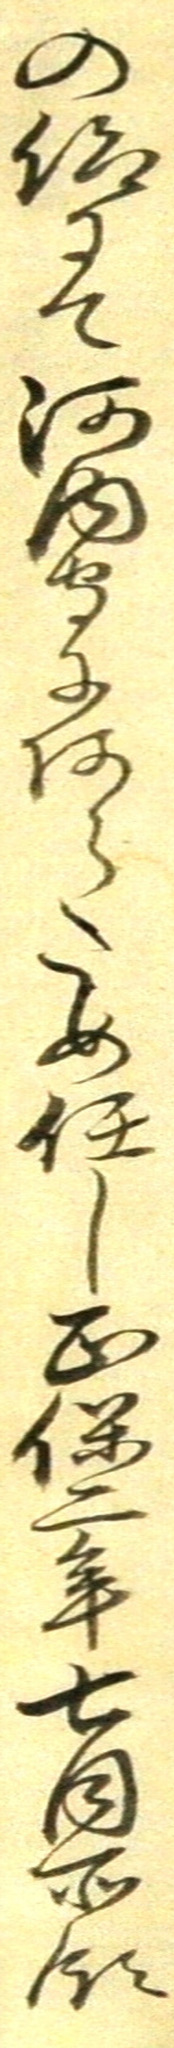の仰にて河内守にあらため任し正保二年七月所領

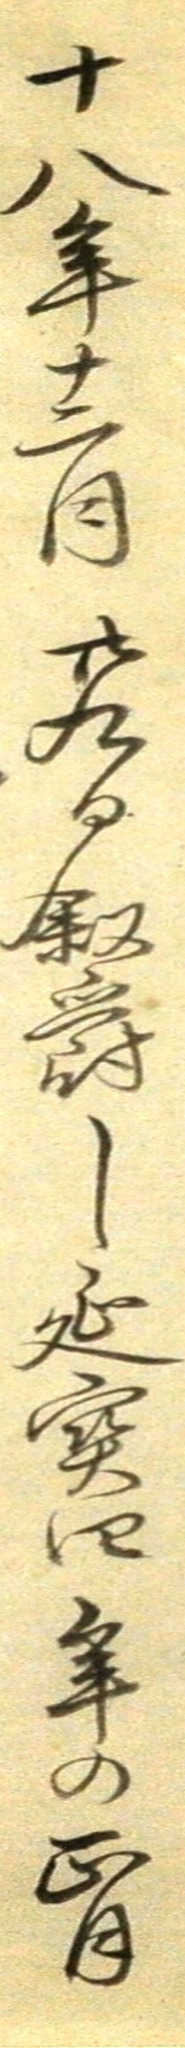十八年十二月二十九日叙爵し延宝四年の正月
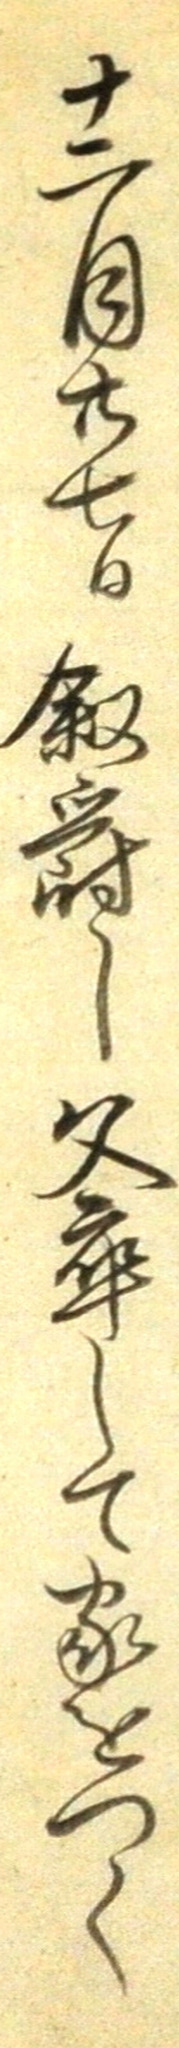十二月廿七日叙爵し父卒して家をつく
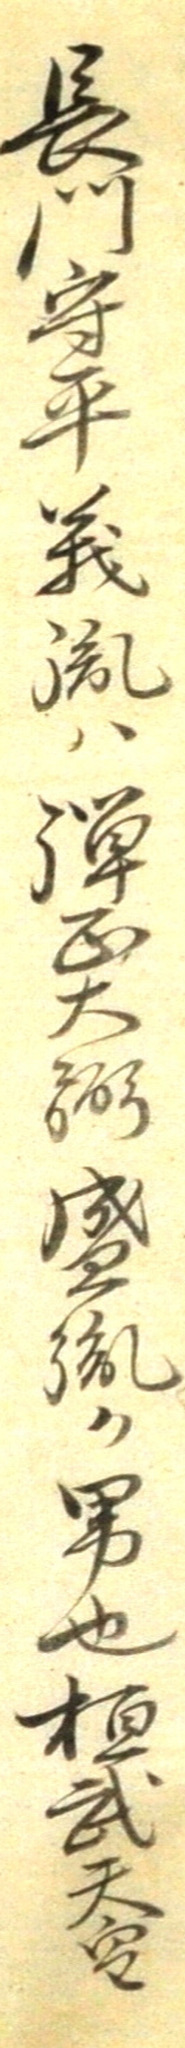長門守平義胤は弾正大弼盛胤か男也桓武天皇
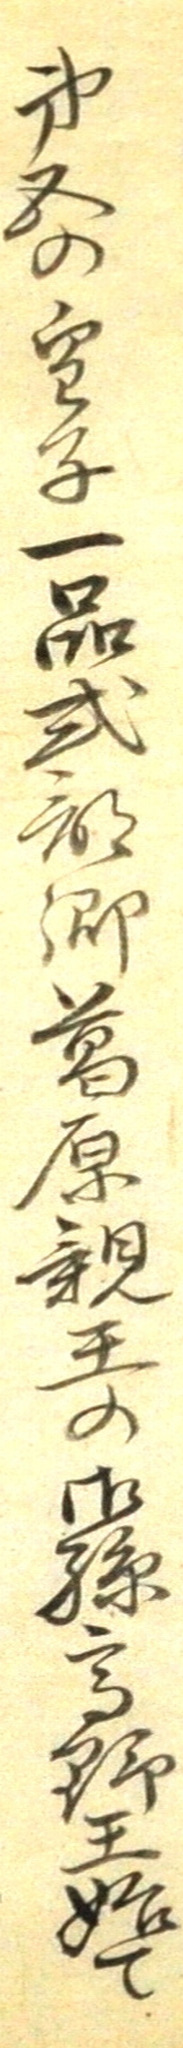第五の皇子一品式部卿葛原親王の御孫高野王始て
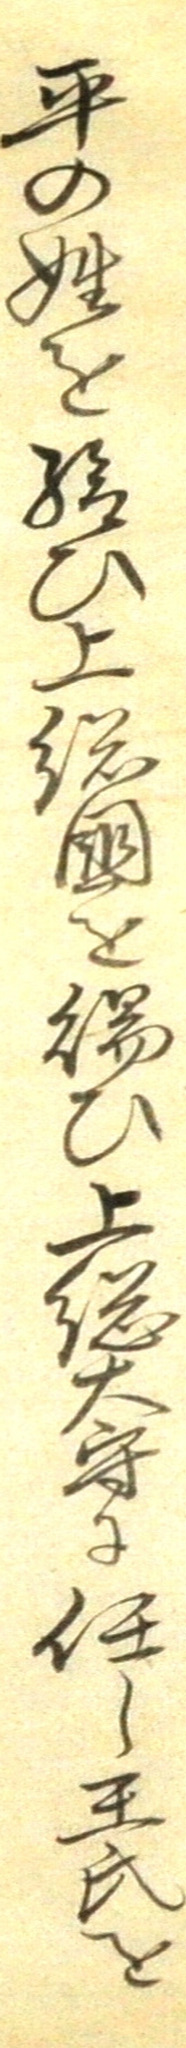平の姓を給ひ上総国を賜ひ上総大守に任し王氏を
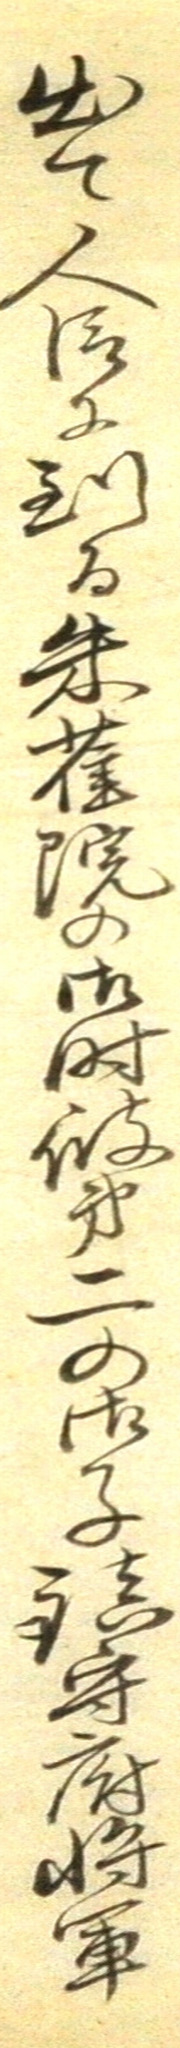出て人臣に到る朱雀院の御時彼第二の御子鎮守府将軍
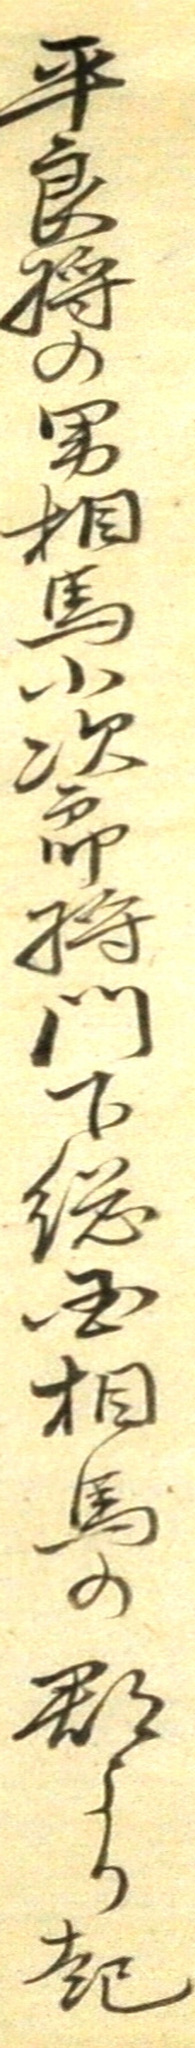平良将の男相馬小次郎将門下総国相馬の郡より起
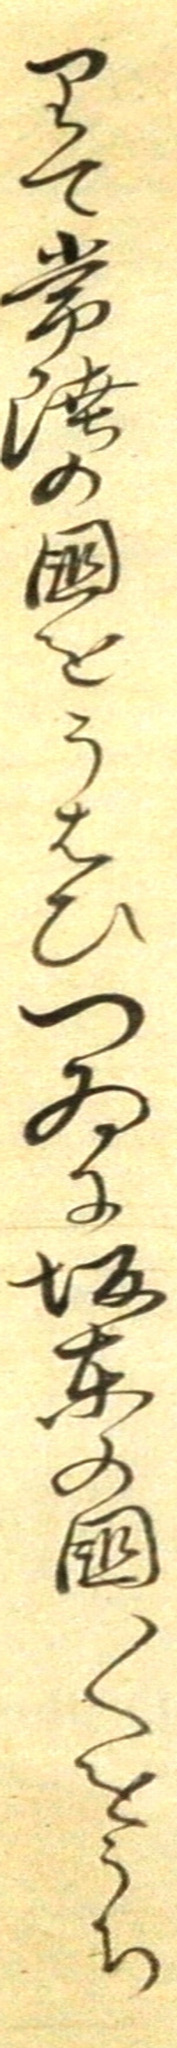りて常陸の国をうはひつゐに坂東の国〳〵をうち
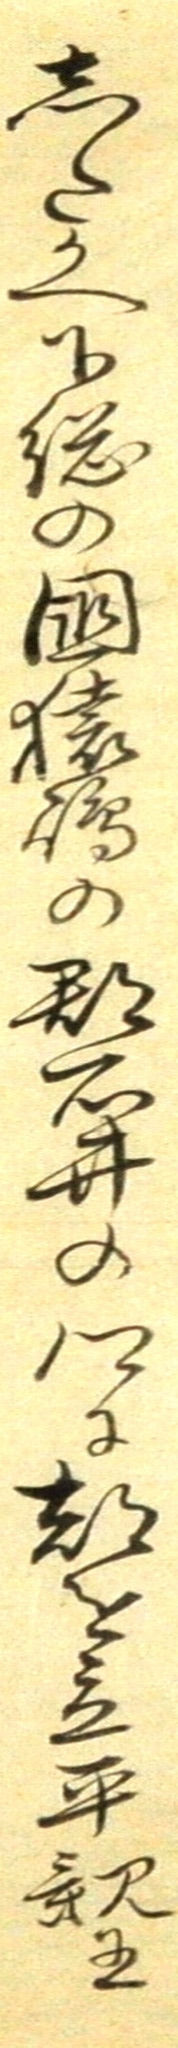したかへ下総の国猿橋の郡石井の郷に都を立平親王
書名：藩翰譜（八・下）
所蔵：伊那市立高遠町図書館・合同会社AMANE
